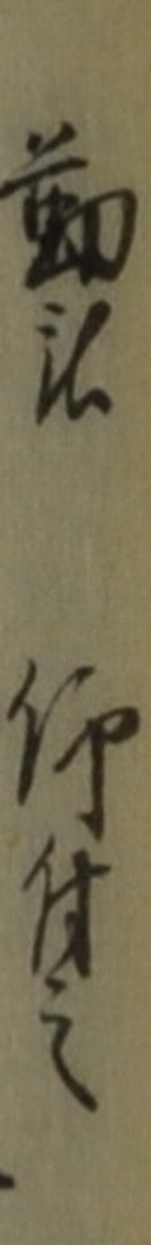勤被仰付之
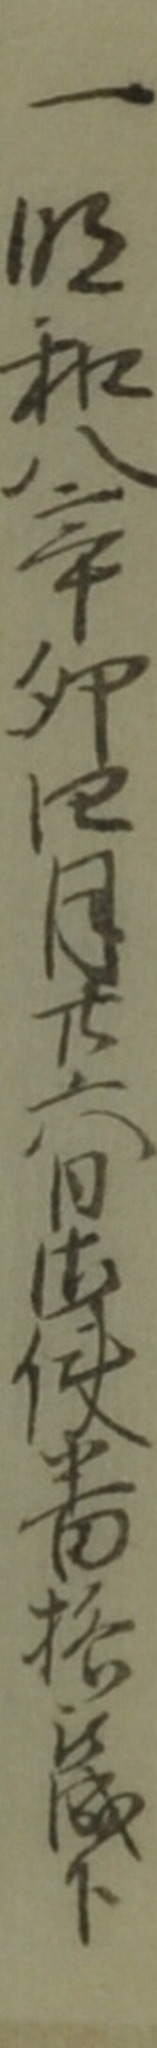一明和八辛卯四月廿六日御使番格被成下
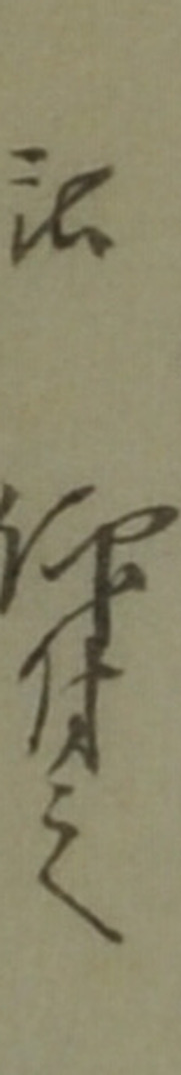被仰付之
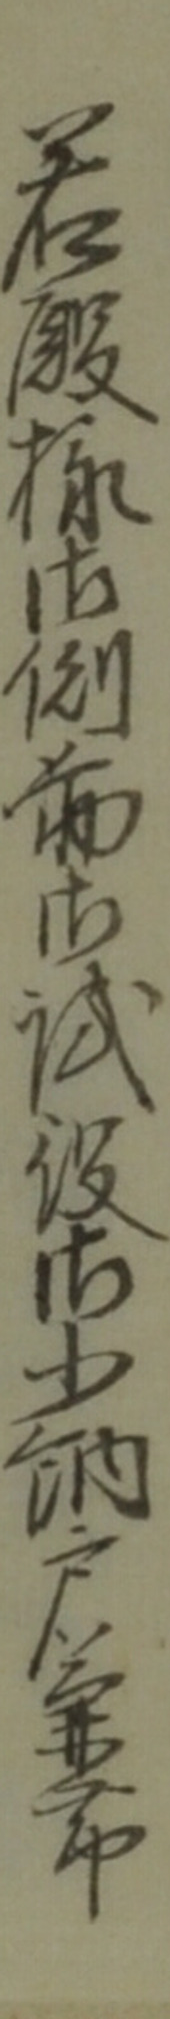若殿様御側勤御試役御小納戸兼帯
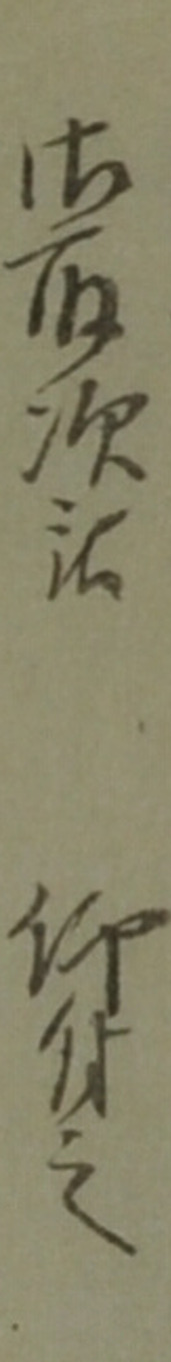御取次被仰付之
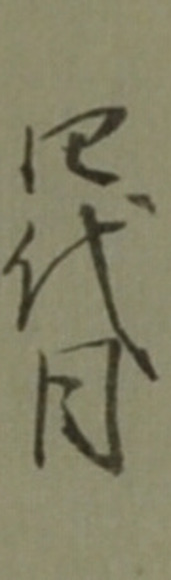四代目
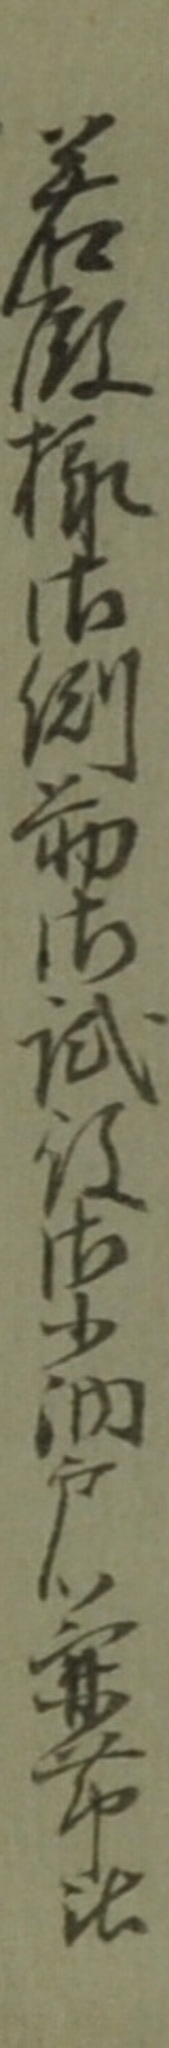若殿様御側勤御試役御小納戸兼帯
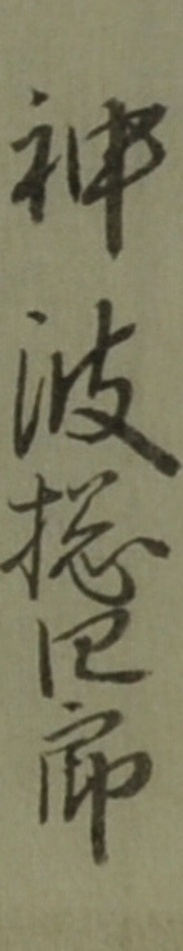神波捴四郎
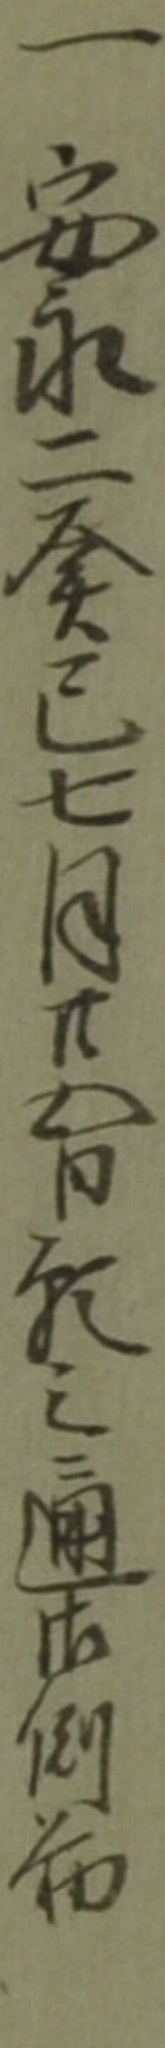一明和九壬辰七月廿五日願之通御側勤
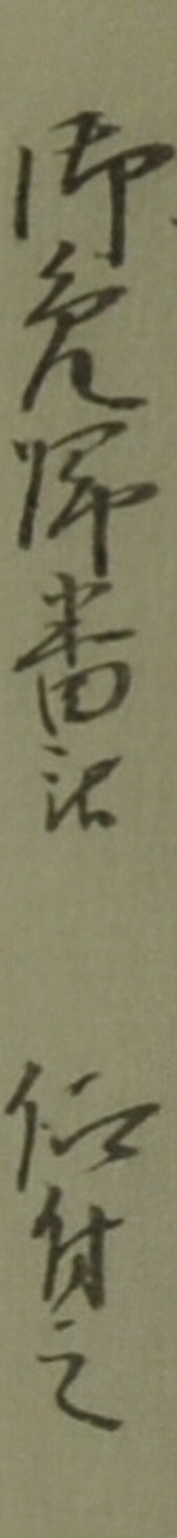御免帰番被仰付之
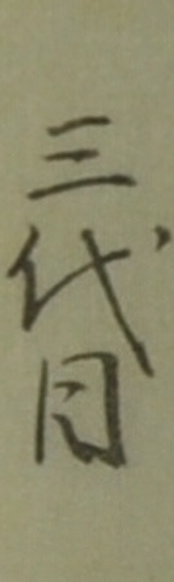三代目

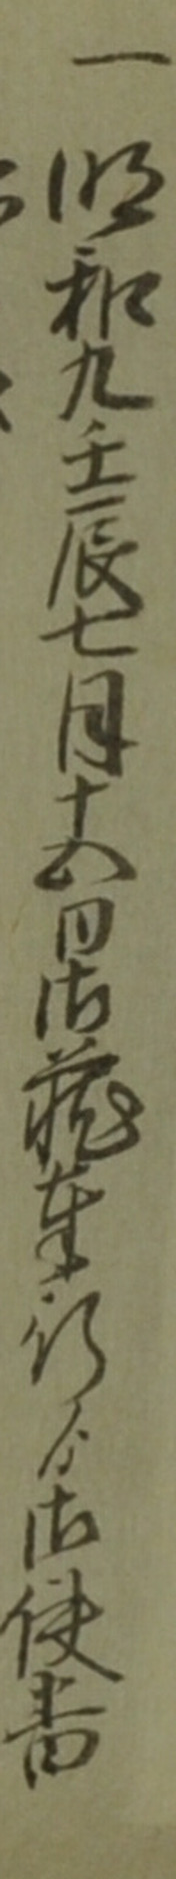一明和九壬辰七月十五日御蔵奉行ゟ御使番
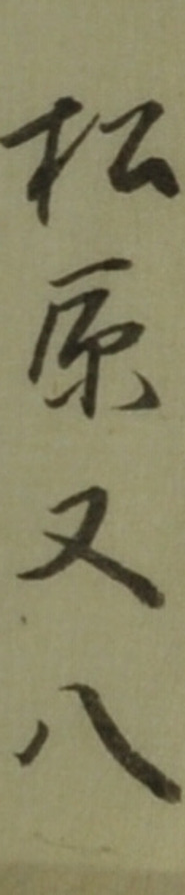松原又八
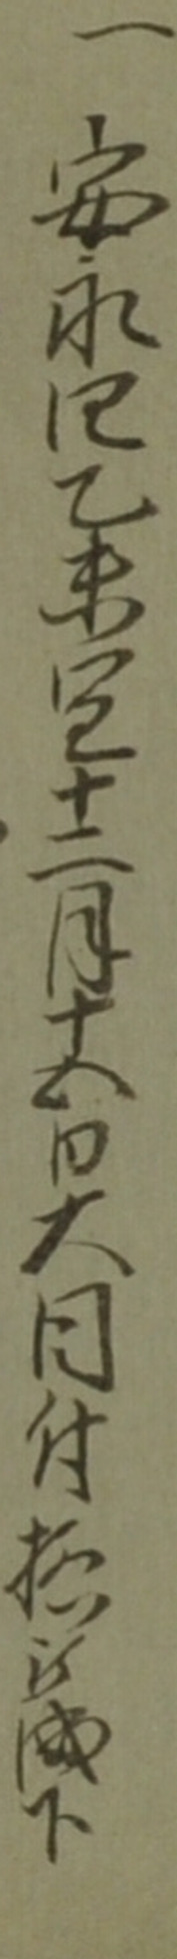一安永四乙未閏十二月十五日大目付格被成下
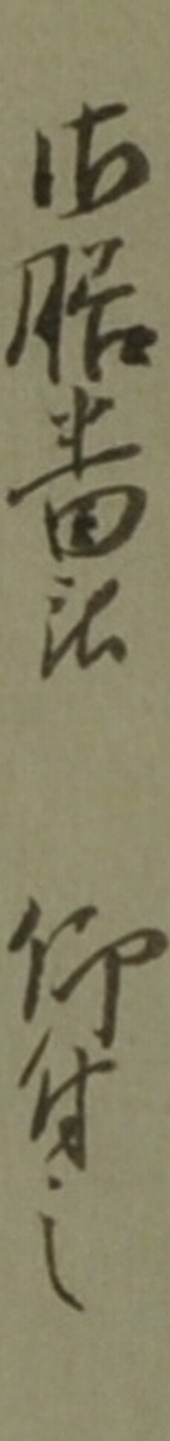御膳番被仰付之
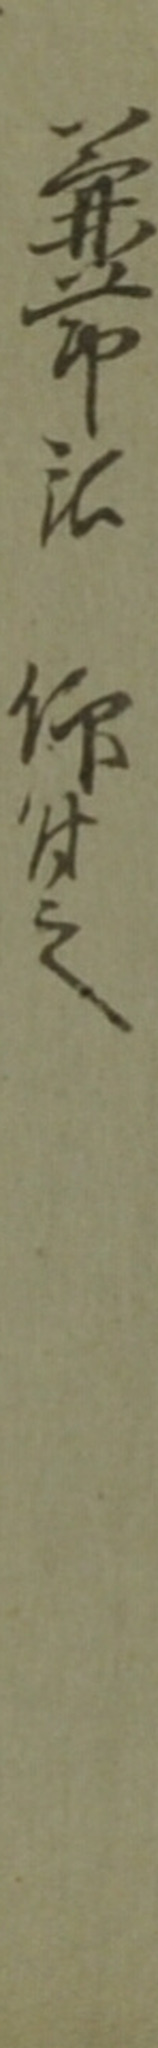兼帯被仰付之
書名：諸御役代々録（四）
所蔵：伊那市立高遠町図書館・合同会社AMANE
